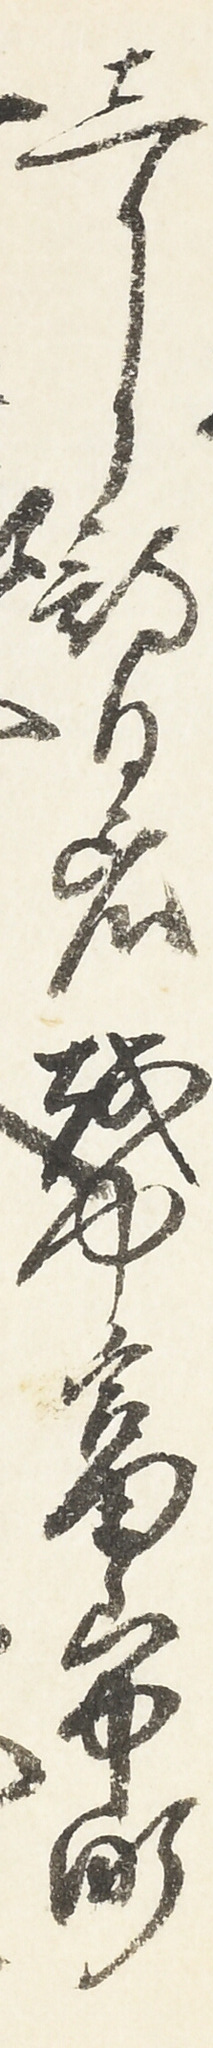十二月朔日着越中富山中町
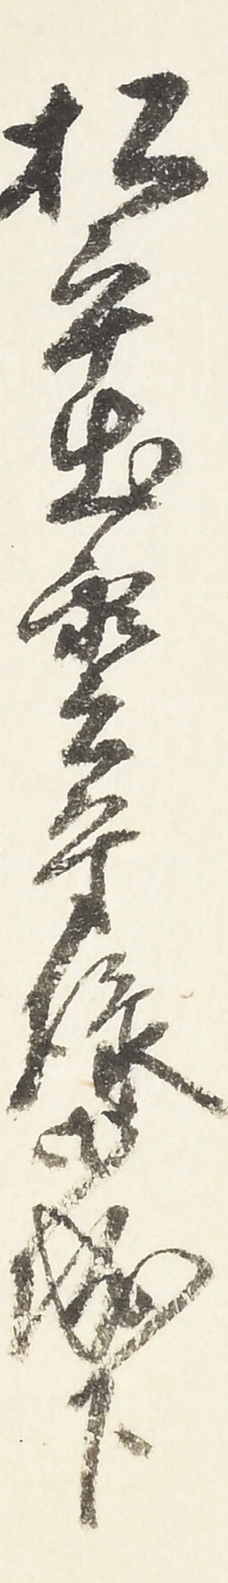松平出雲守様御城下
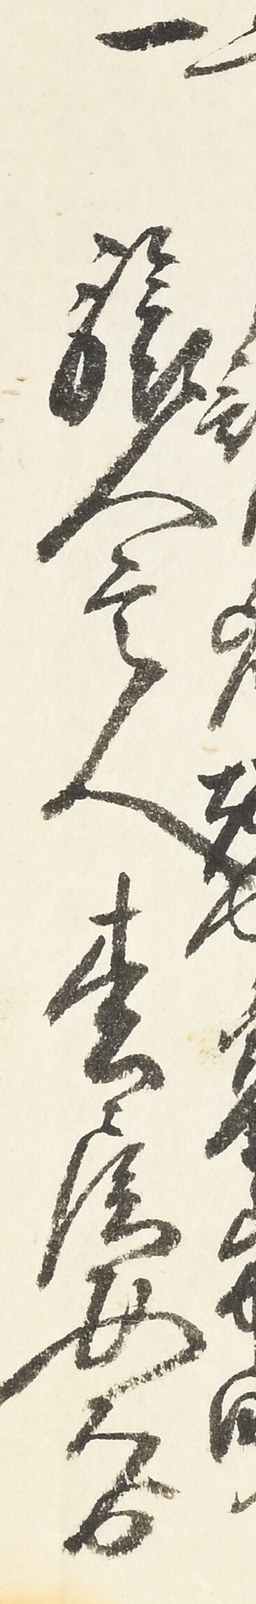一旅人壱人松屋安右衛門
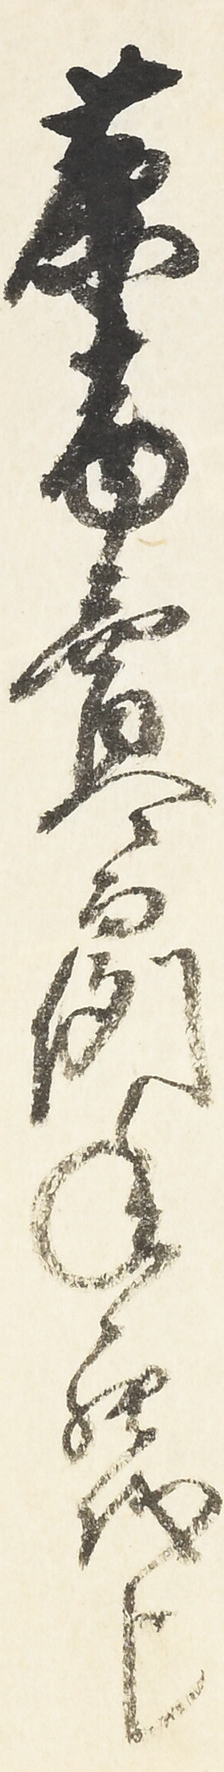薬商売ニ而例年罷越申候
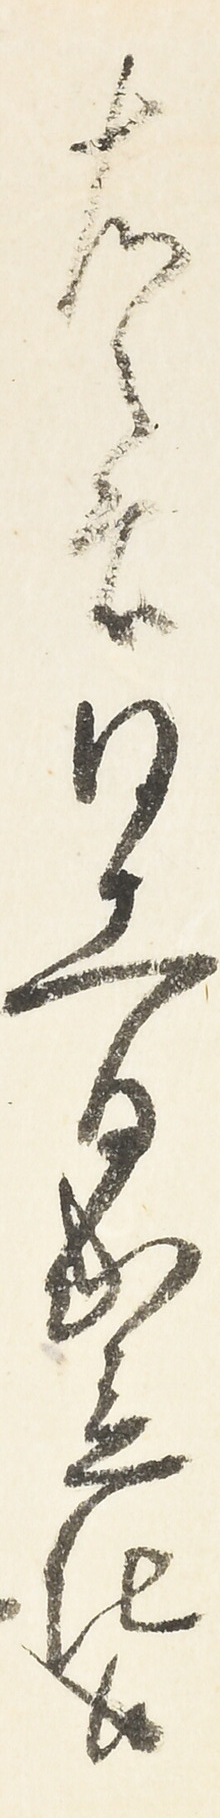右之者同十一日出立仕候
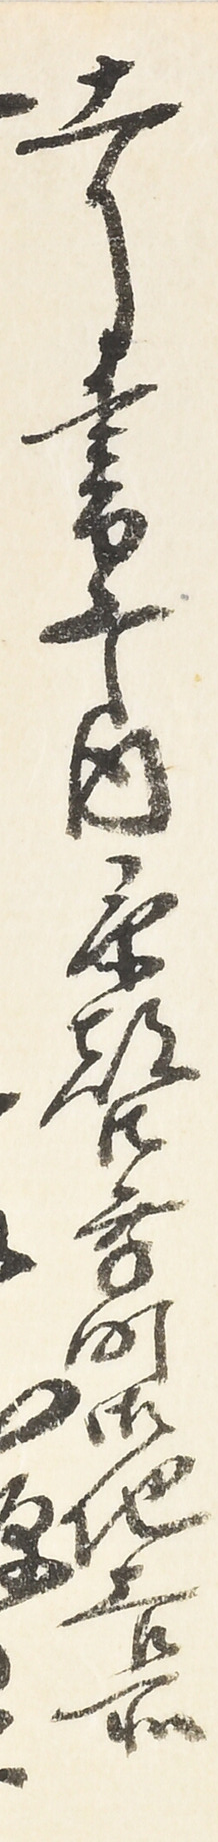十一月書上之内京都御幸町御池上ル所
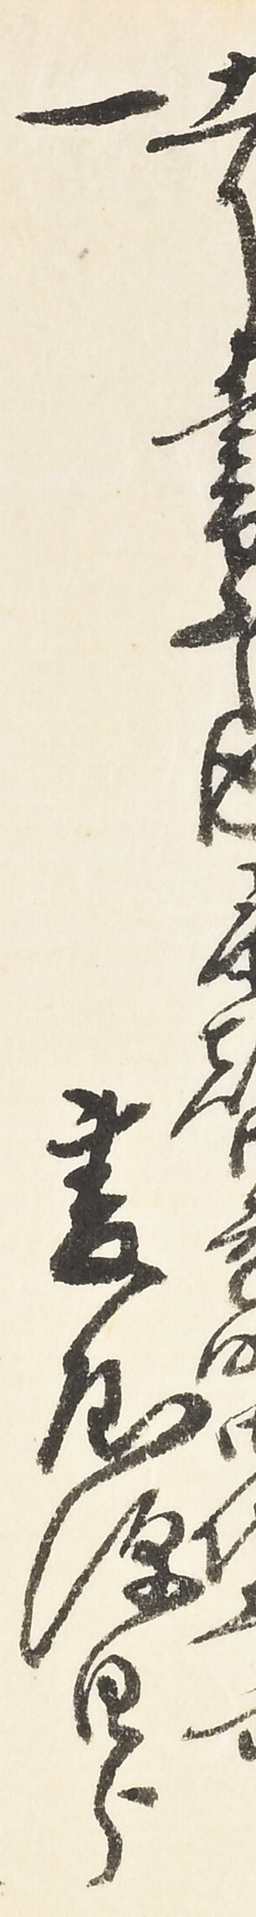一菱屋源四郎
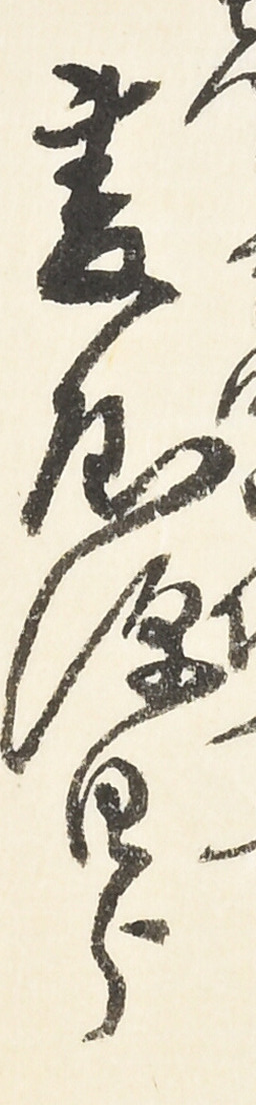一菱屋源四郎
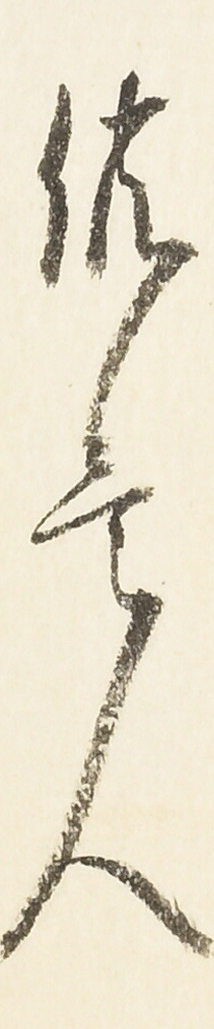供壱人
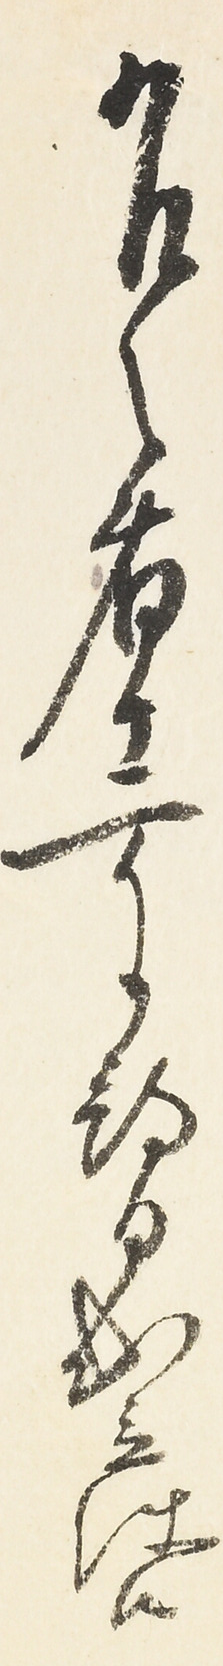右之者十二月二日出立仕候
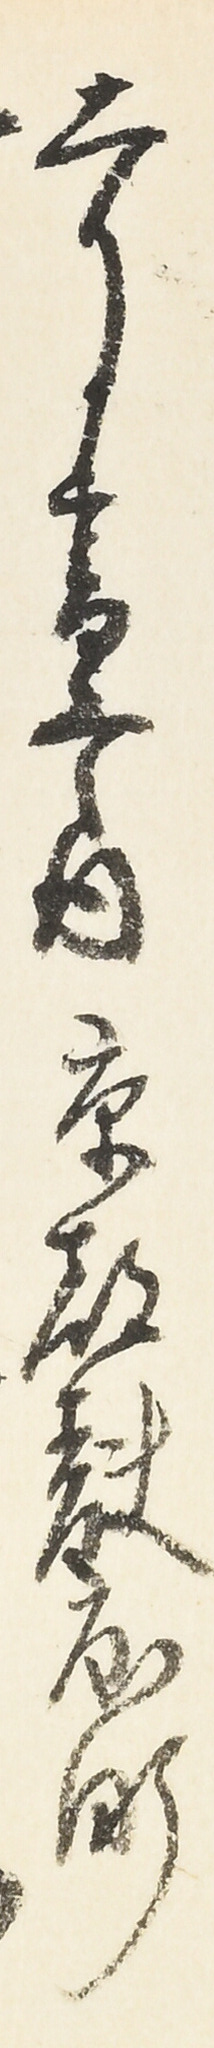十一月書上之内京都麩屋町
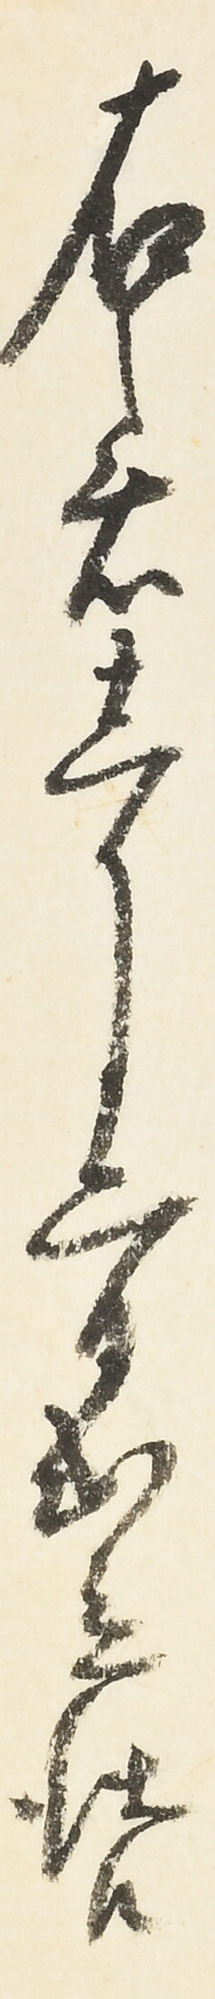右之者十二月二日出立仕候
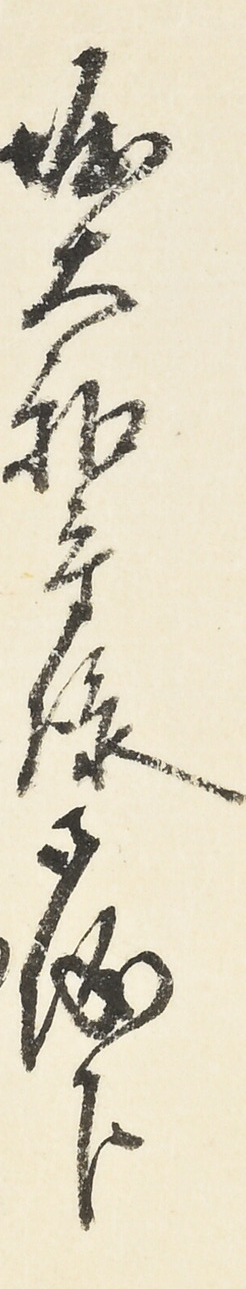堀大和守様御城下
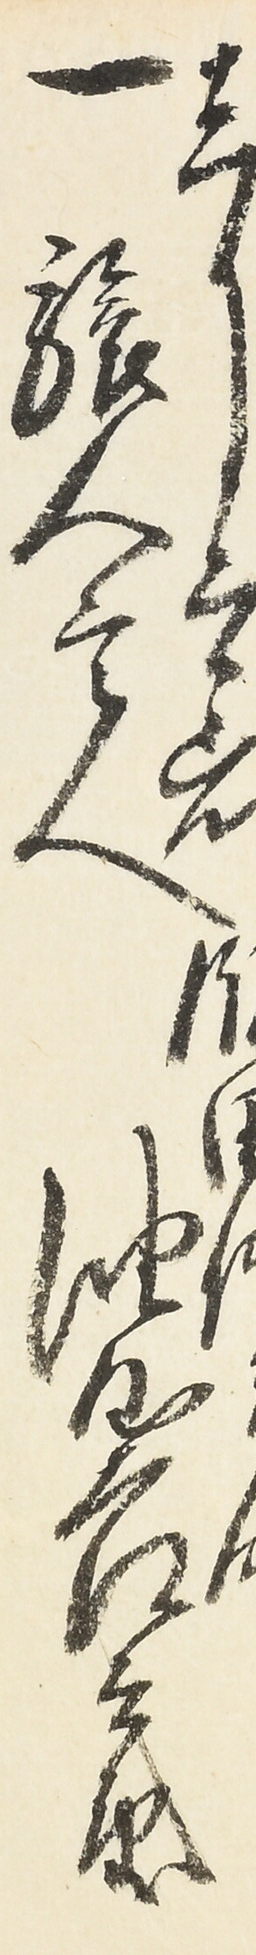一旅人壱人油屋善兵衛
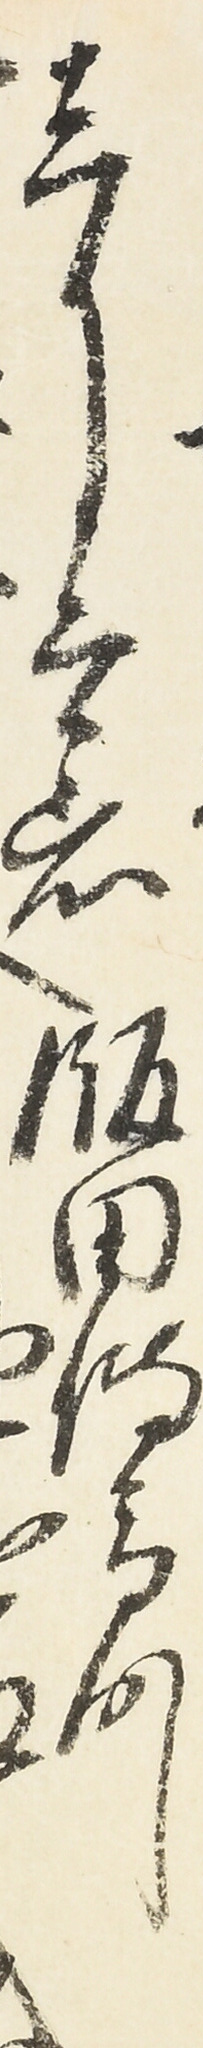十二月二日着飯田伝馬町
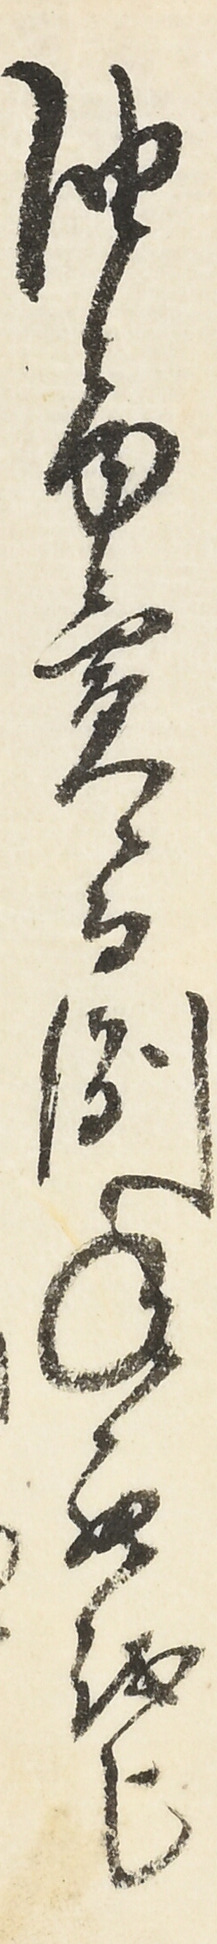油商売ニ而例年罷越申候
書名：町中旅人泊控帳
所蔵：伊那市立高遠町図書館・合同会社AMANE
